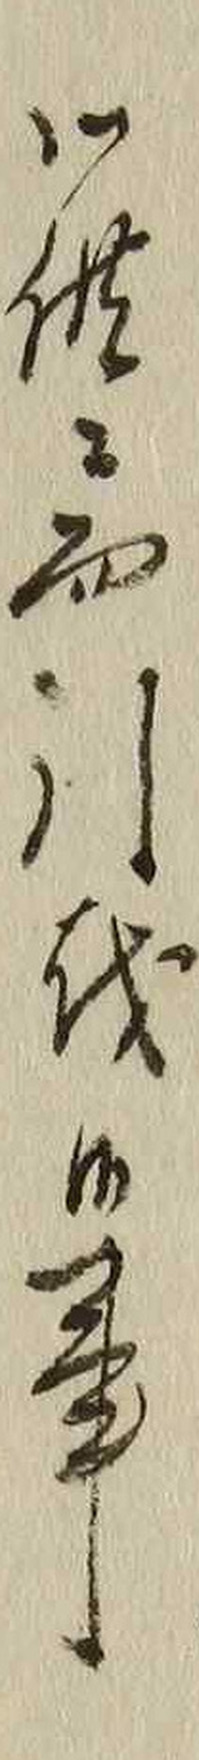御供ニ而引越候事
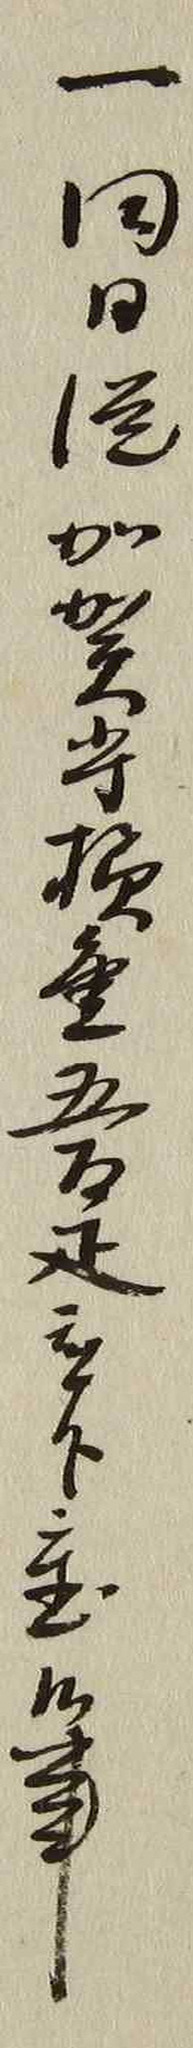一同月従加賀守様金五百疋被下置候事
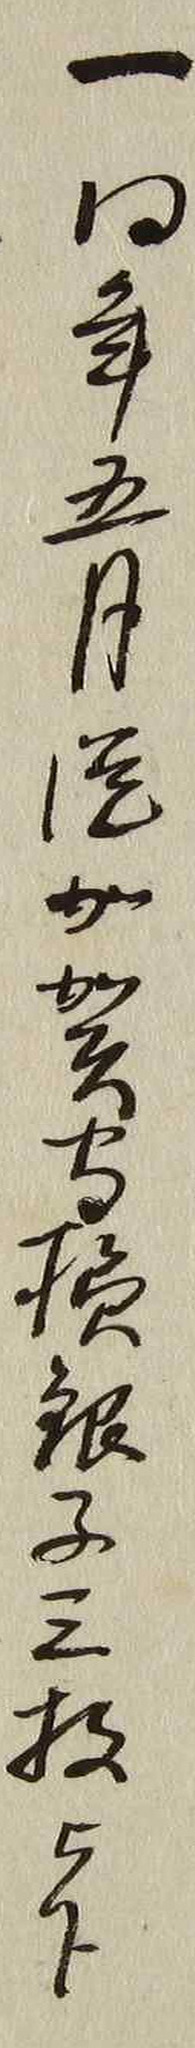一同年五月従加賀守様銀子三枚被下
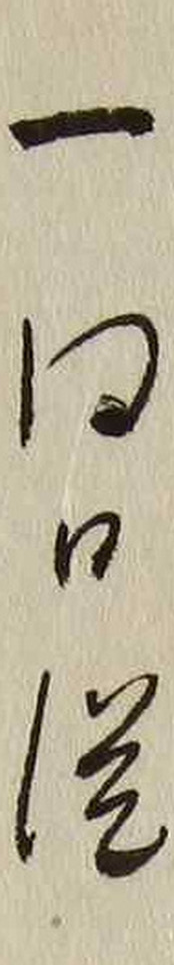一同月従
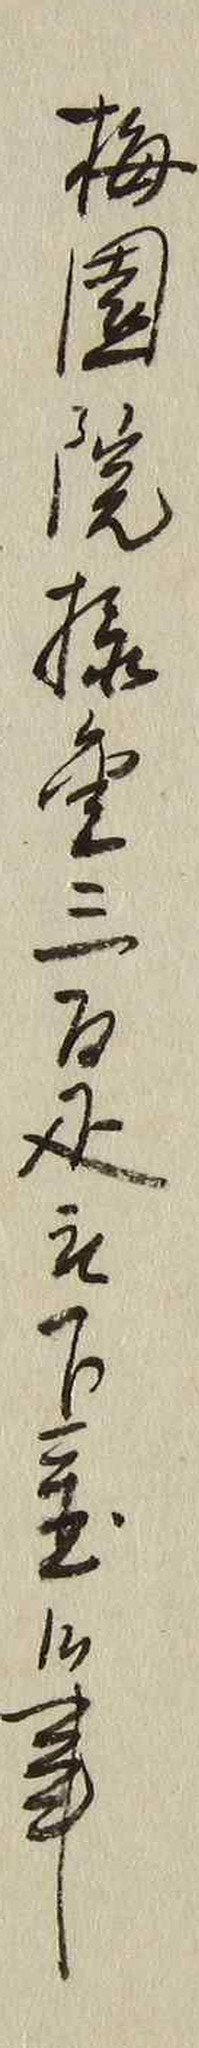梅園院様金三百疋被下置候事
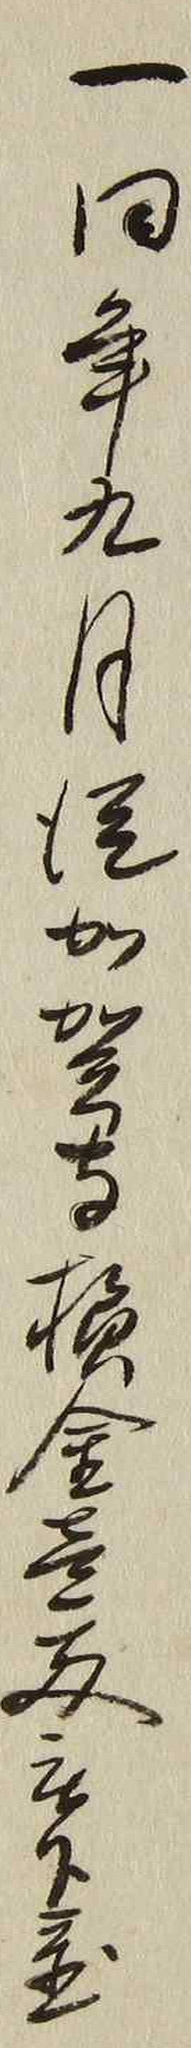一同年九月従加賀守様金壱両被下置
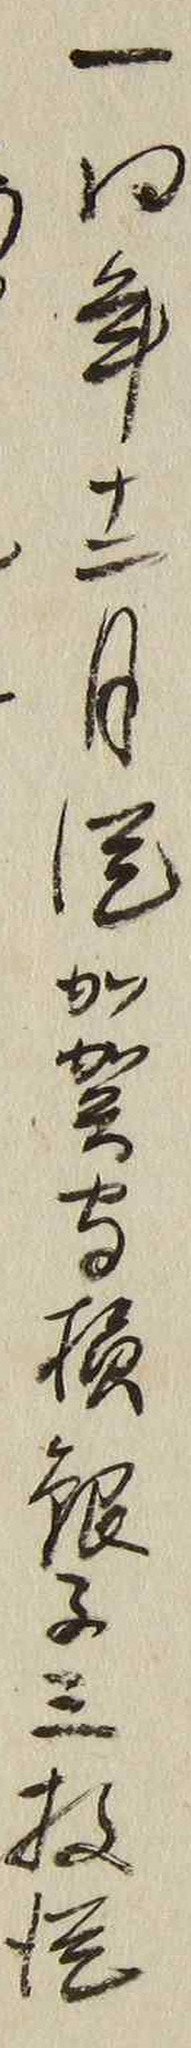一同年十二月従加賀守様銀子三枚従
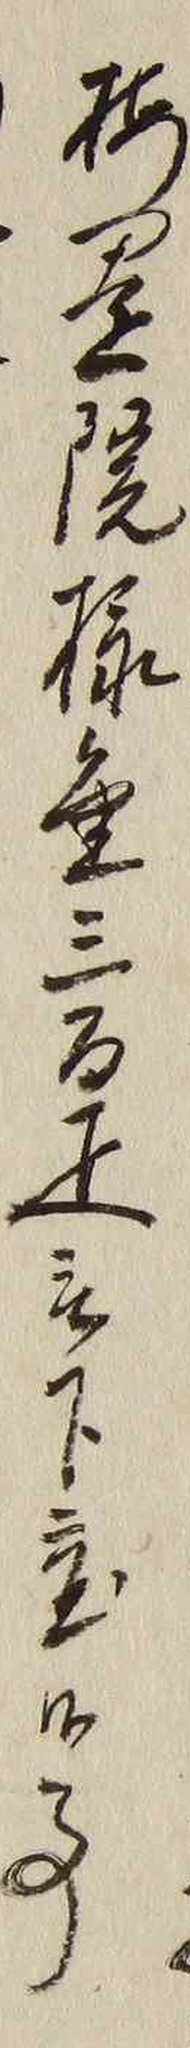梅園院様金三百疋被下置候事
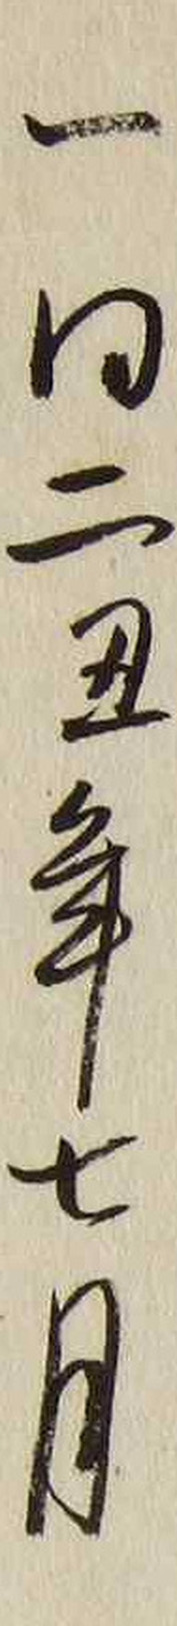一同二丑年七月

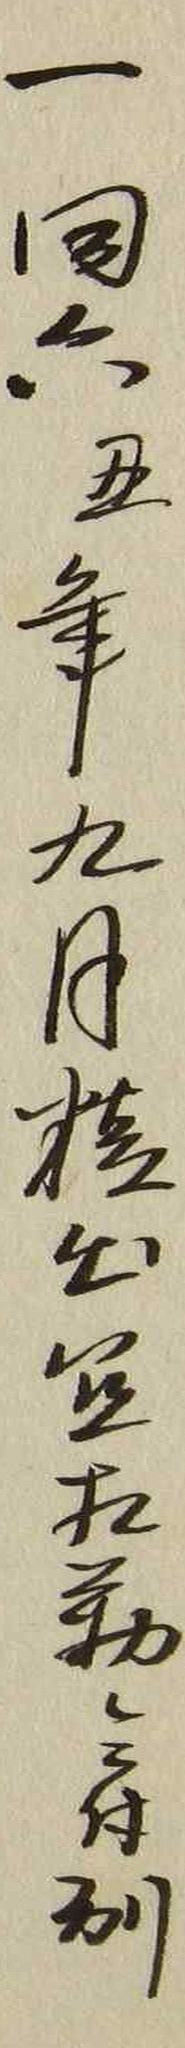一同六丑年九月精出宜相勤候ニ付別
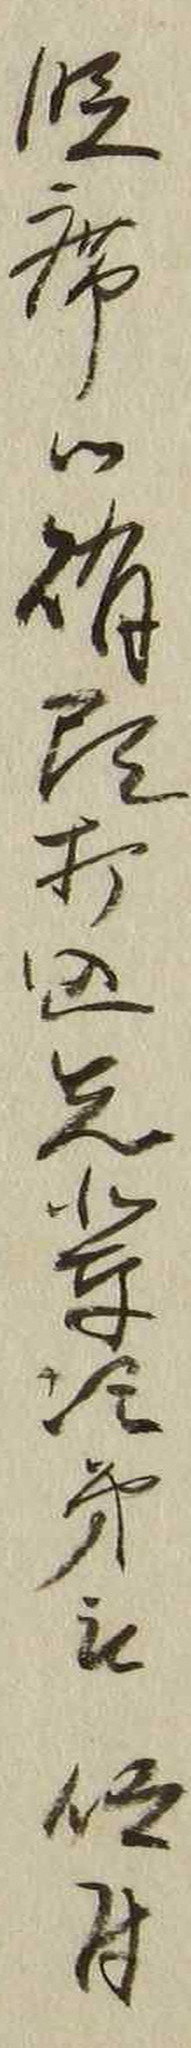段席御賄頭打込先輩次第被仰付
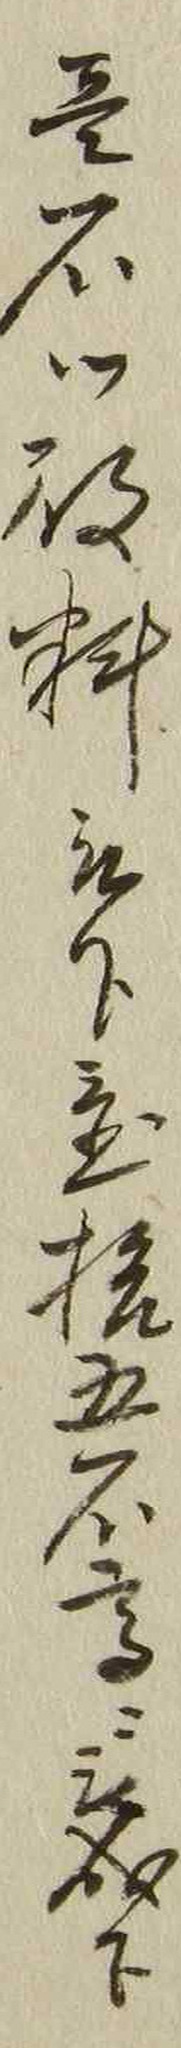壱石御役料被下置拾五石高ニ被成下
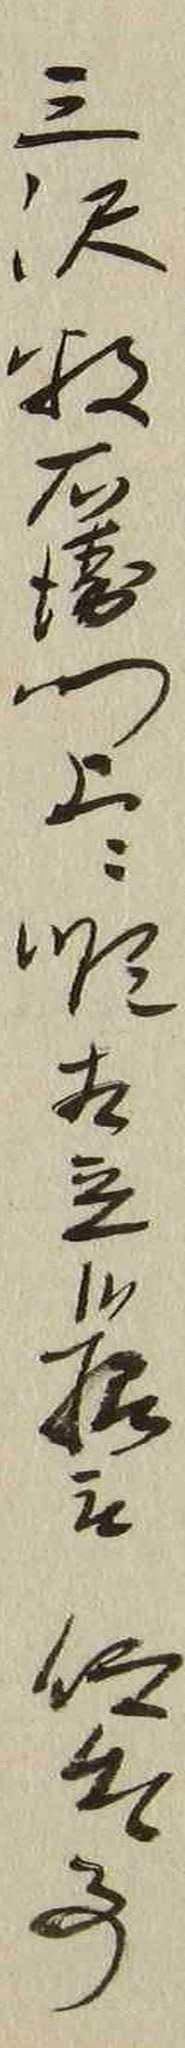三沢牧右衛門上ニ順相立候様被仰出候事
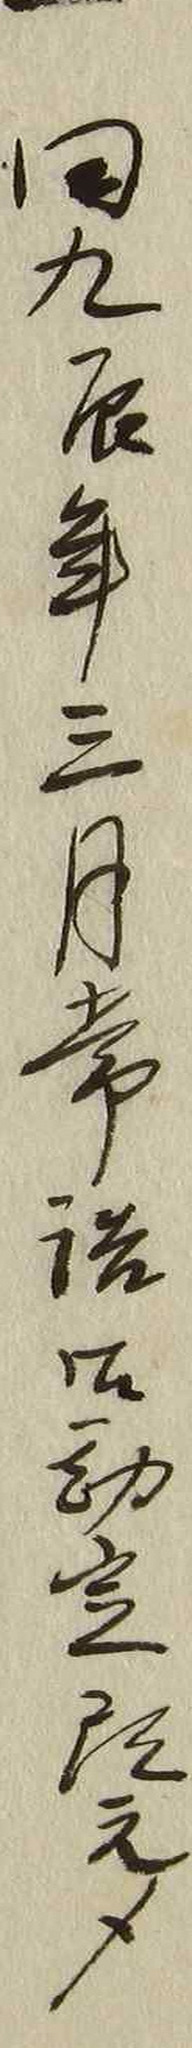一同九辰年三月常詰御勤定頭元〆
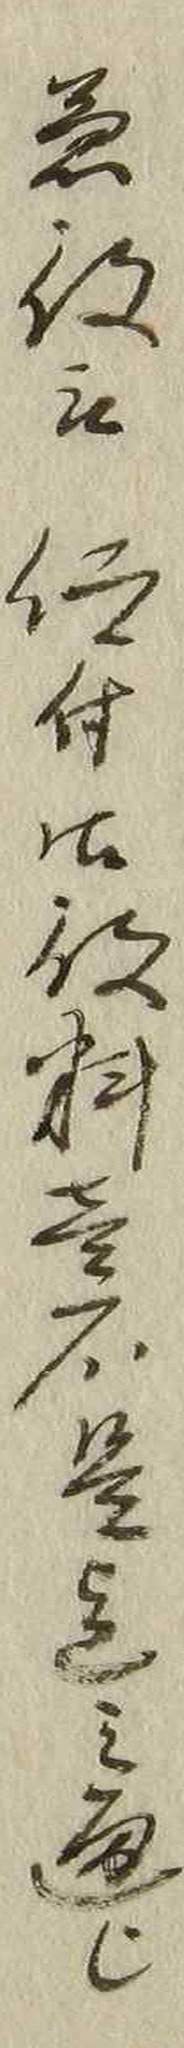兼役被仰付御役料壱石是迄之通被
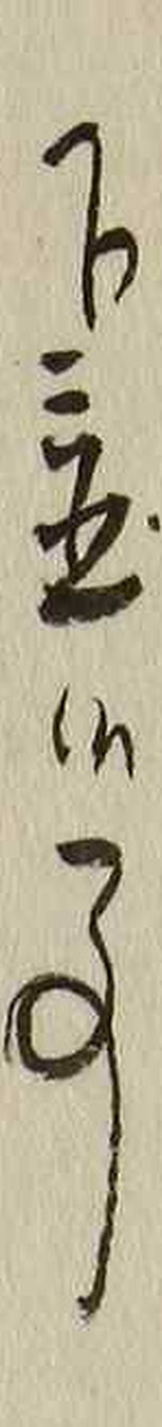下置候事
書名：諸士系譜　巻之353　す之部3
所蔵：会津若松市立会津図書館
